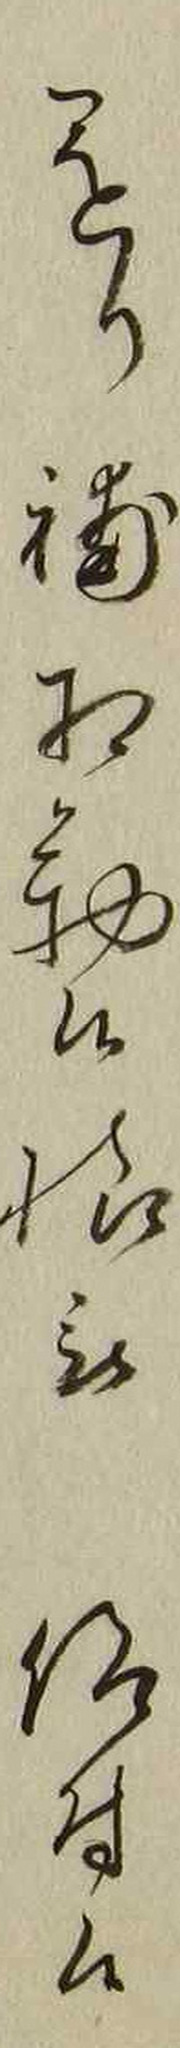懸り補相勤候様被仰付候
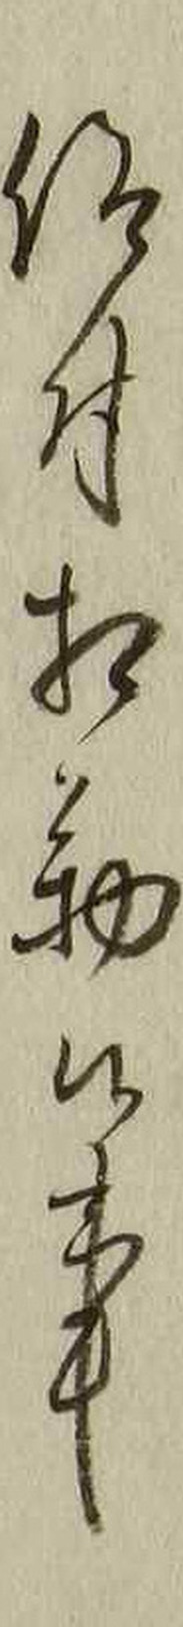仰付相勤候事
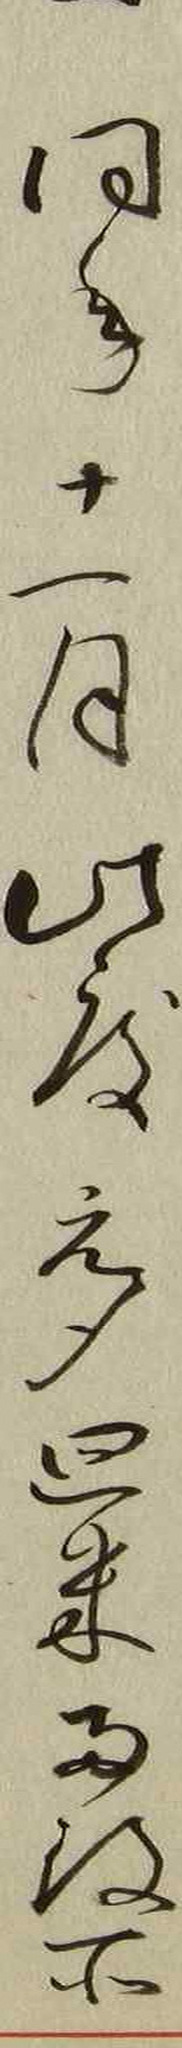一同年十一月此度元〆廻米両役所
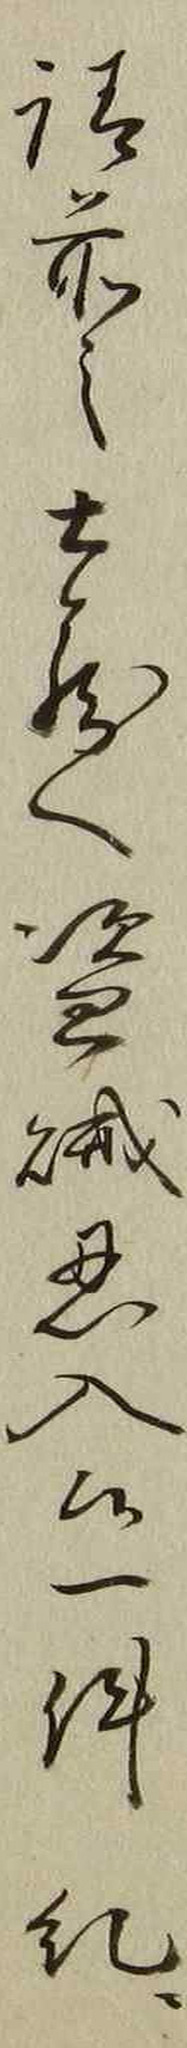請所之土蔵へ盗賊忍入候一件糺に
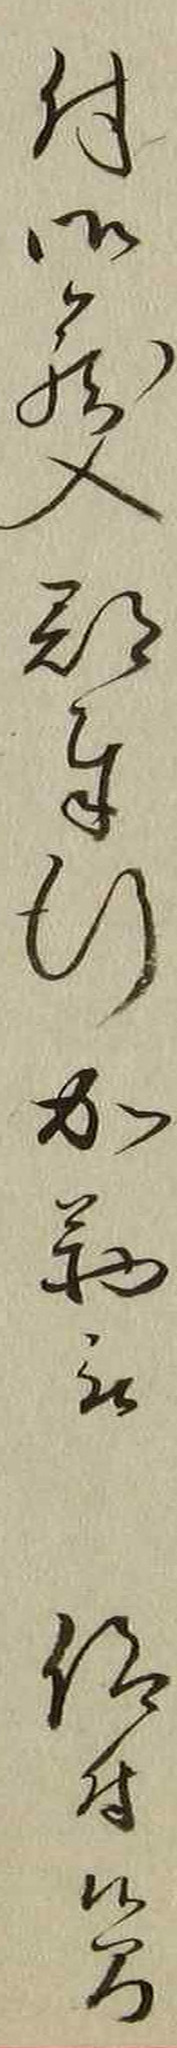付御蔵入郡奉行加勤被仰付候間
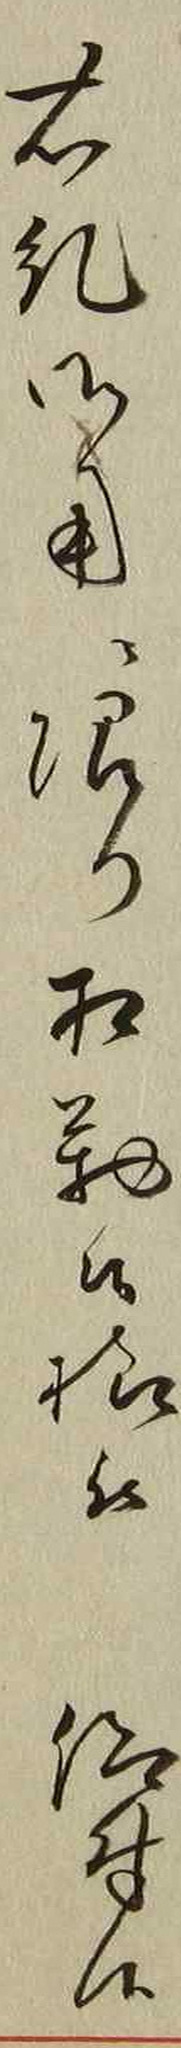右糺御用に限り相勤候様被仰付候
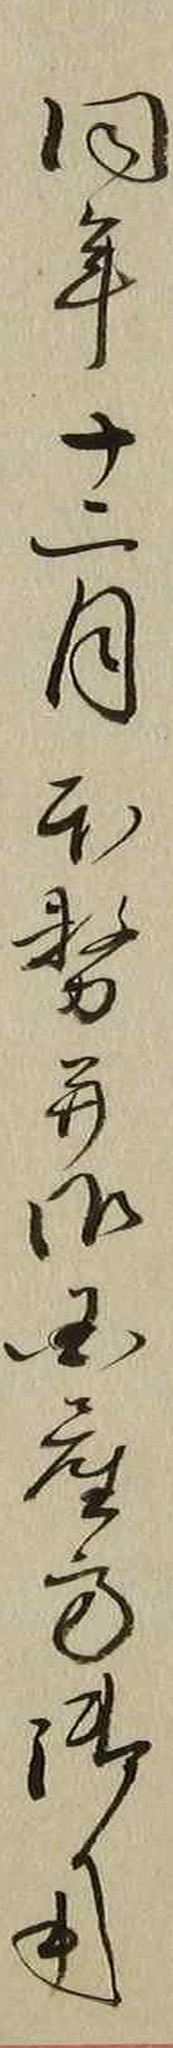一同年十二月本務并御国産方御用
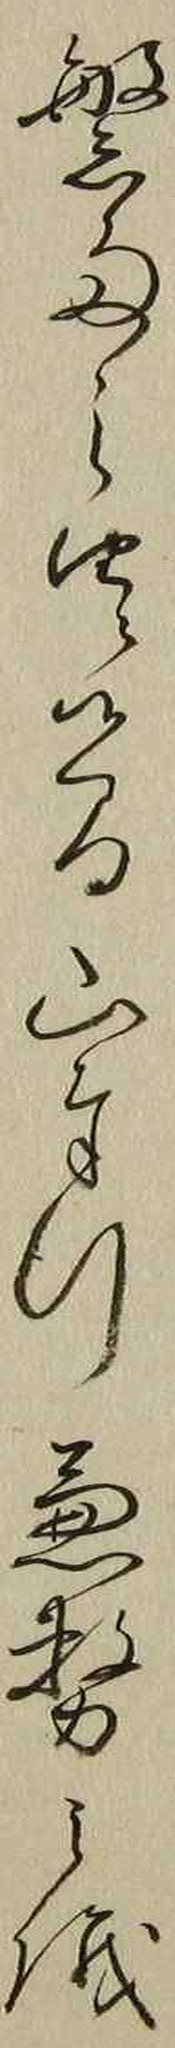繫多之由に候間山奉行兼務の儀
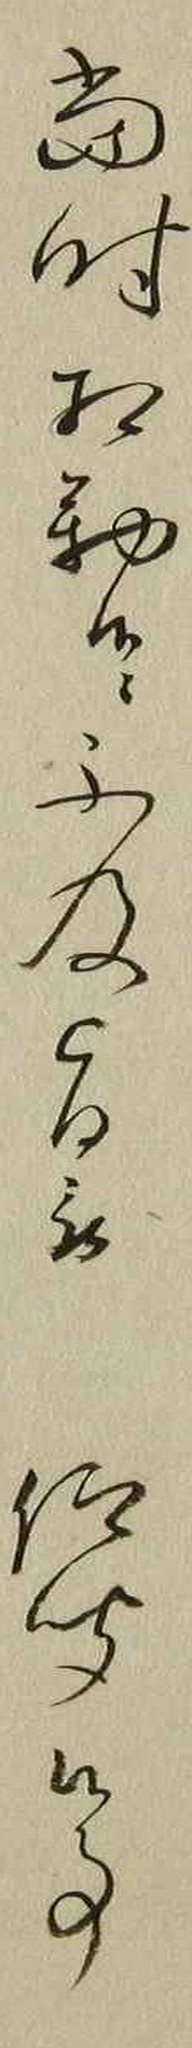当時相勤候に不及旨被仰聞候事
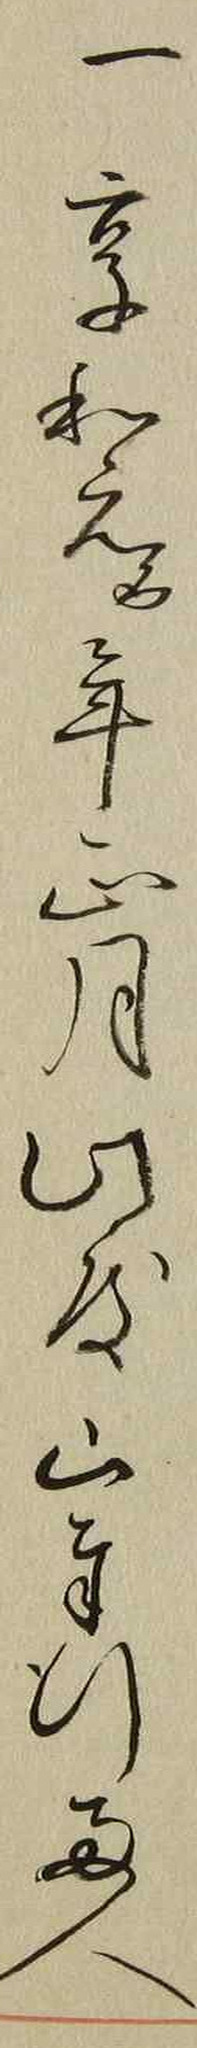一享和元酉年正月此度山奉行両人
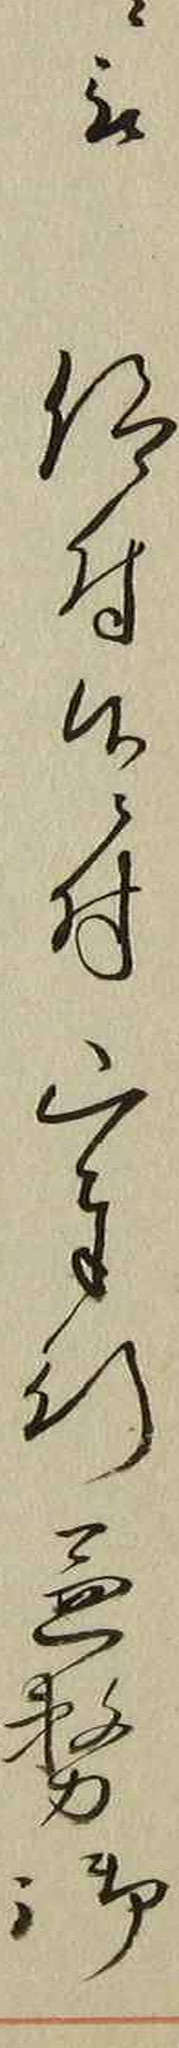に被仰付候に付山奉行兼務御
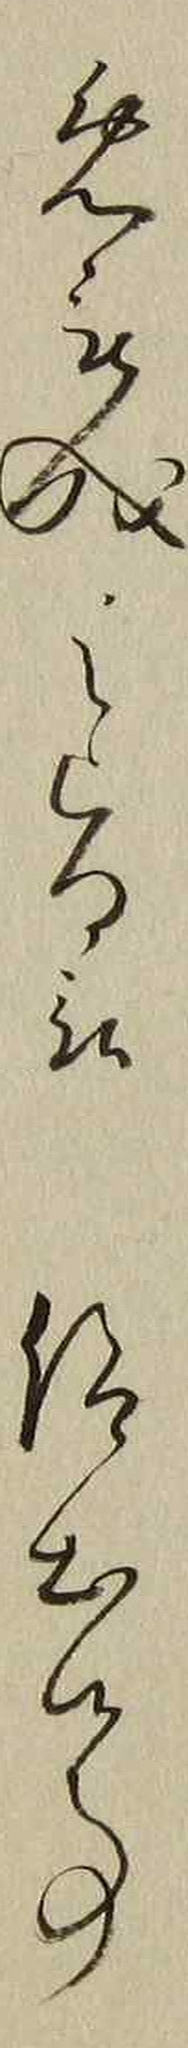免被成之旨被仰出候事
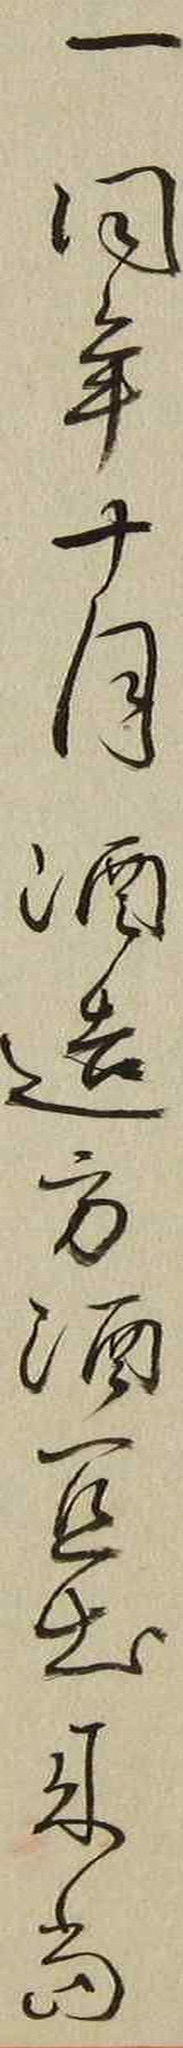一同年十月酒造方酒宜出来当
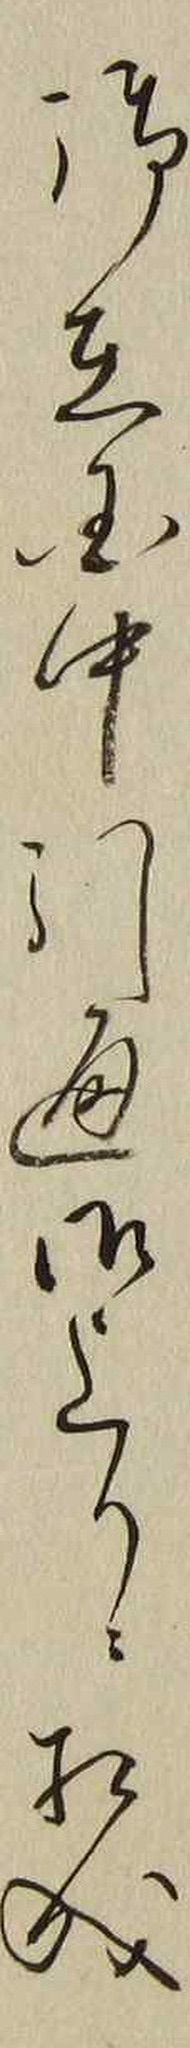御在国中引通御上りに相成
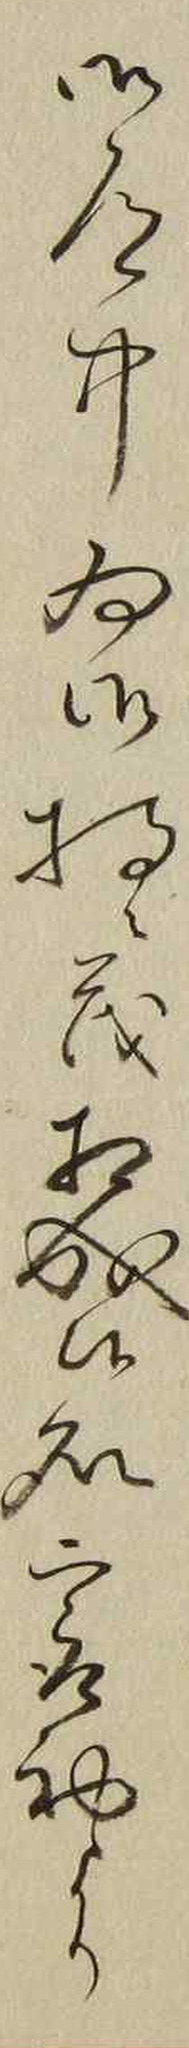御道中為御持に茂相成候処最初より
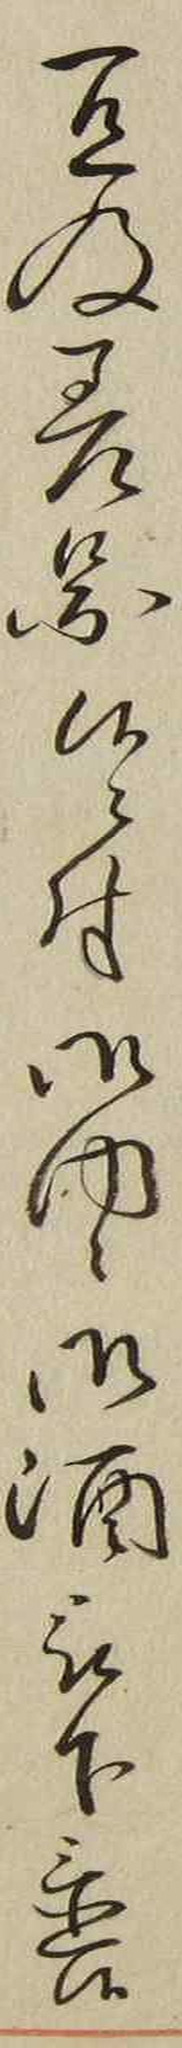宜及差図候に付御内々御酒被下置候
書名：諸士系譜　巻之3　い之部3
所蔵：会津若松市立会津図書館
